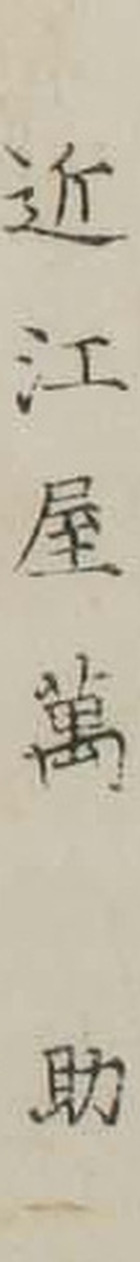近江屋萬助
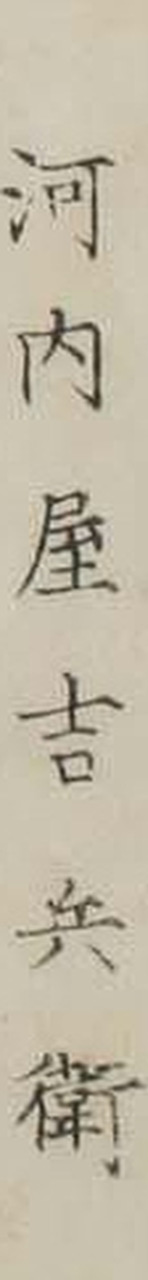河内屋吉兵衛
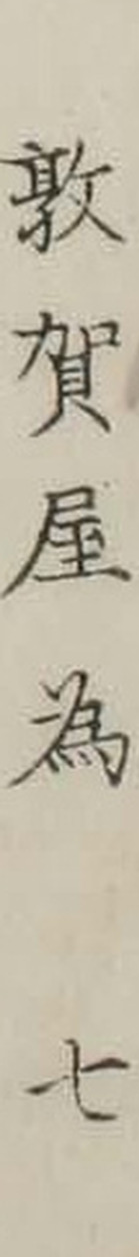敦賀屋為七
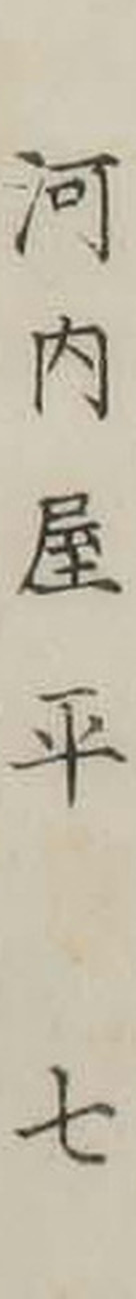河内屋平七
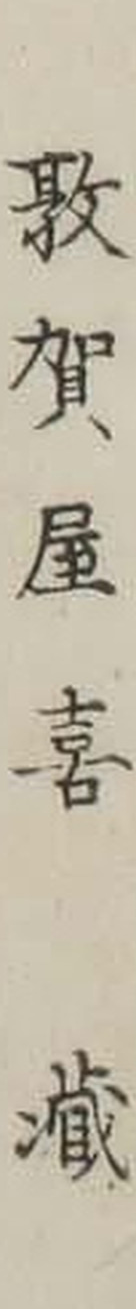敦賀屋喜蔵
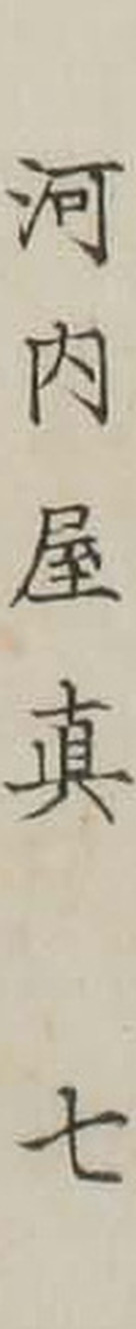河内屋真七
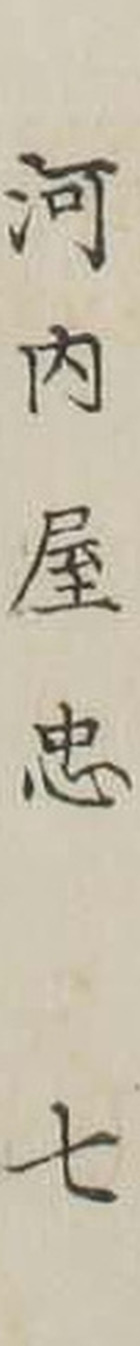河内屋忠七
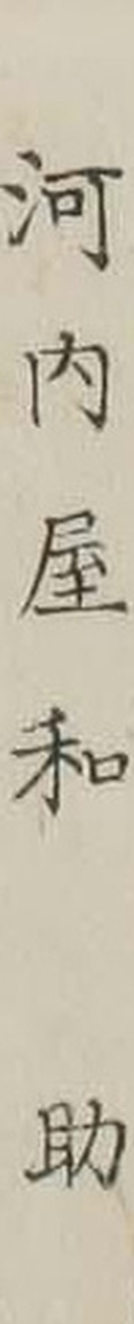河内屋和助
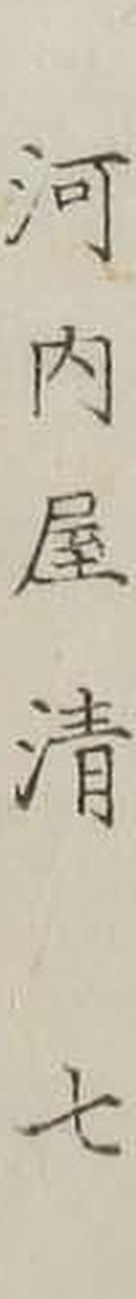河内屋清七
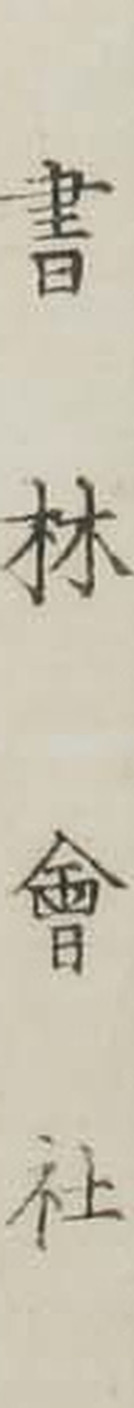書林会社
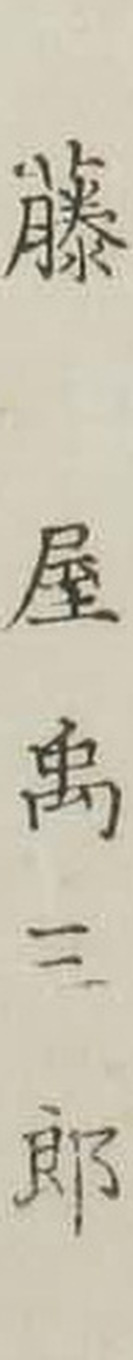藤屋禹三郎
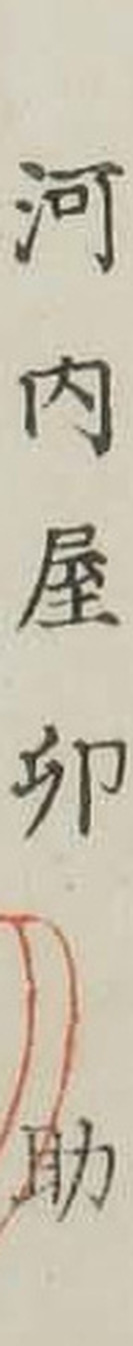河内屋卯助
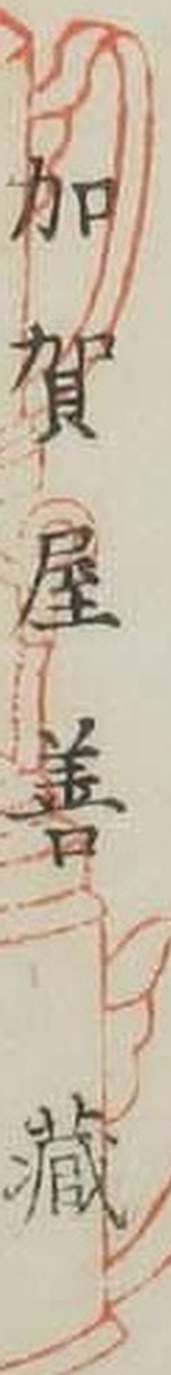加賀屋善蔵
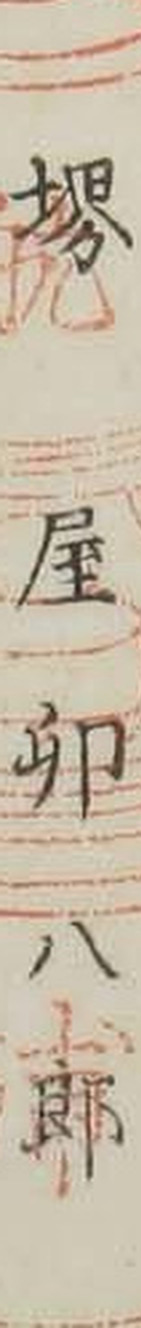堺屋卯八郎
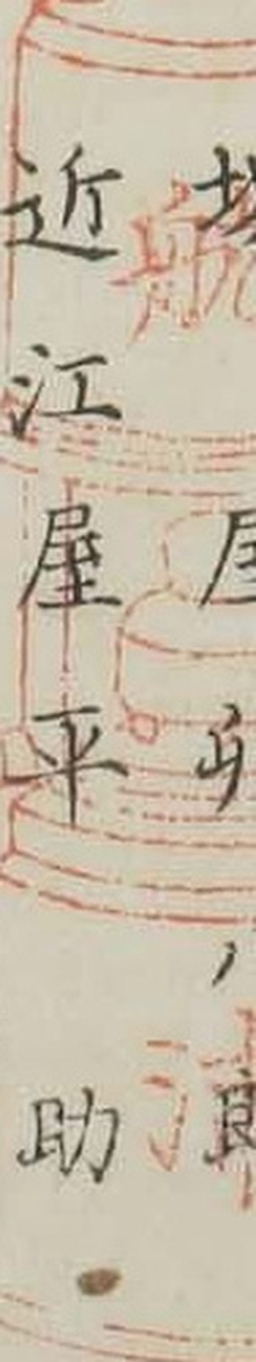近江屋平助
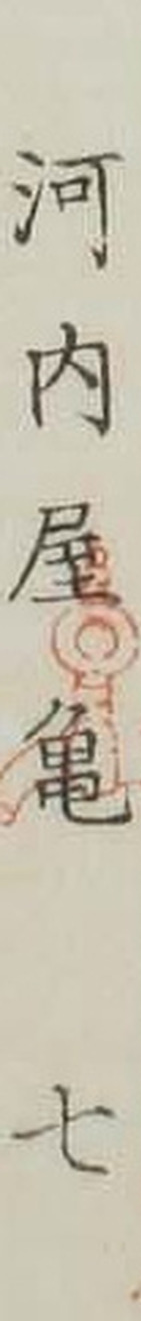河内屋亀七
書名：開化往来
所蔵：東京学芸大学教育コンテンツアーカイブ
